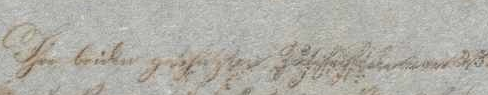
Ihre beiden geschätzten Zuschriften vom 23.
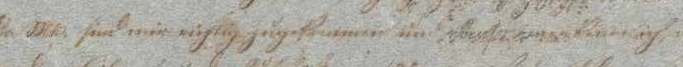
dss Mts. sind mir richtig zugekommen und ebensoerkläre ich, daß ich ihrer
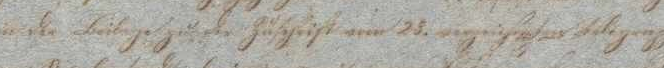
in der Beilage zu der Zuschrift vom 23. verzeichneten
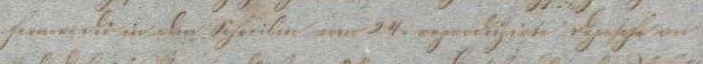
ferner die in dem Schreiben vom 24. reproduzirte Depesche an
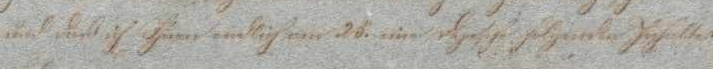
und daß ich Ihnen endlich am 25. eine Depesche folgenden Inhaltes
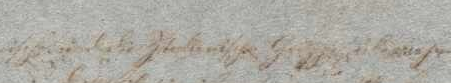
Italienische Gruppe übernehmen die ihnen
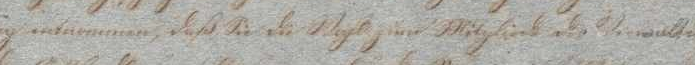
friedigung entnommen, daß Sie die Wahl zum Mitgliede des Verwaltungs-
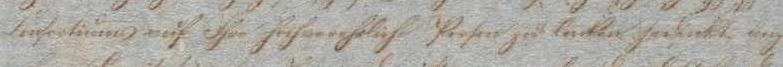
Consortiums auf Ihre hochverehrliche Person zu lenken gedenkt anzu-
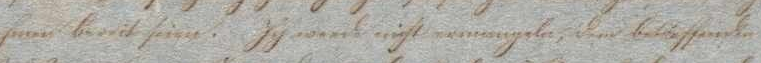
nehmen bereit seien. Ich werde nicht ermangeln, dem betreffenden
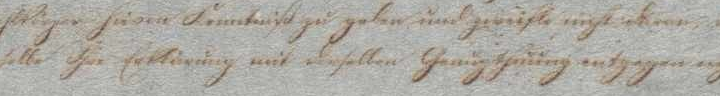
Ihre Erklärung mit derselben Genugthuung entgegen
